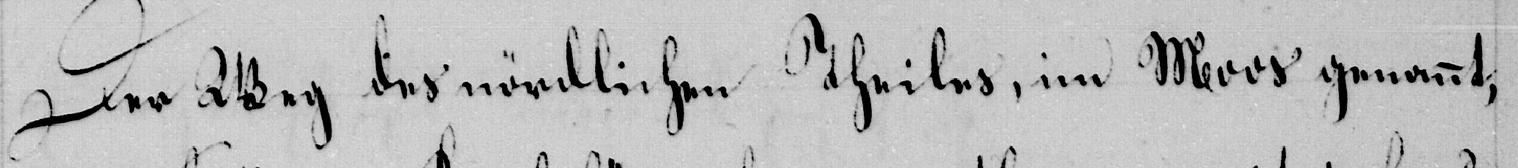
Der Weg des nördlichen Theiles, im Moos genannt,
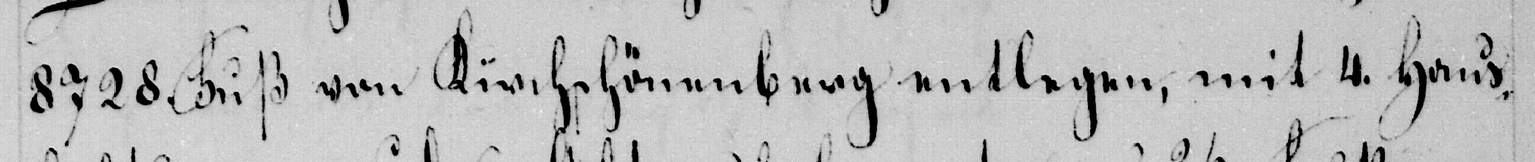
8728. Fuß von Kirchschönenberg entlegen, mit 4. Haus¬
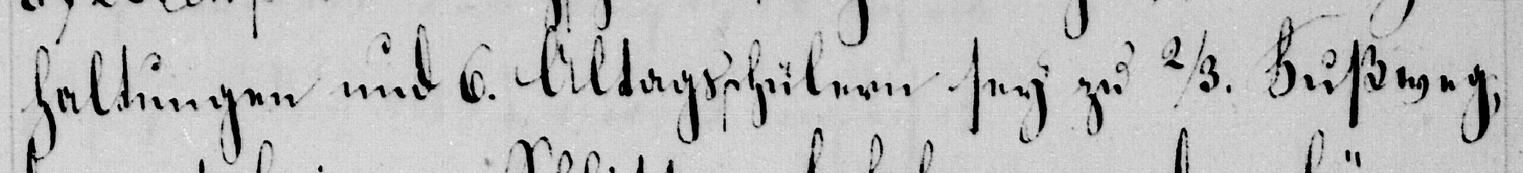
haltungen und 6. Altagsschülern sey zu 2/3. Fußweg,
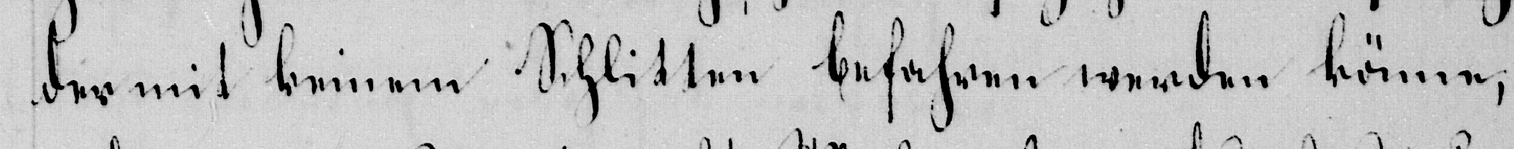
der mit keinem Schlitten befahren werden könne,
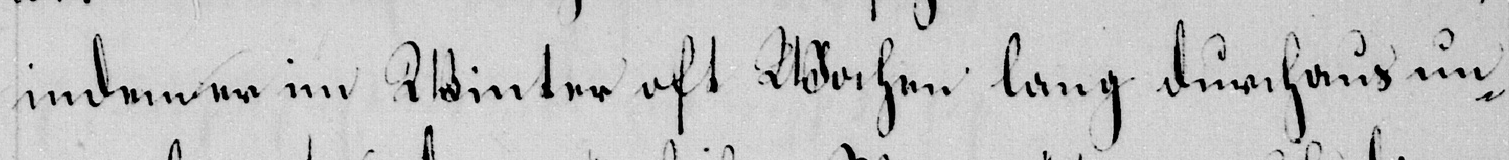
indem er im Winter oft Wochen lang durchaus un¬
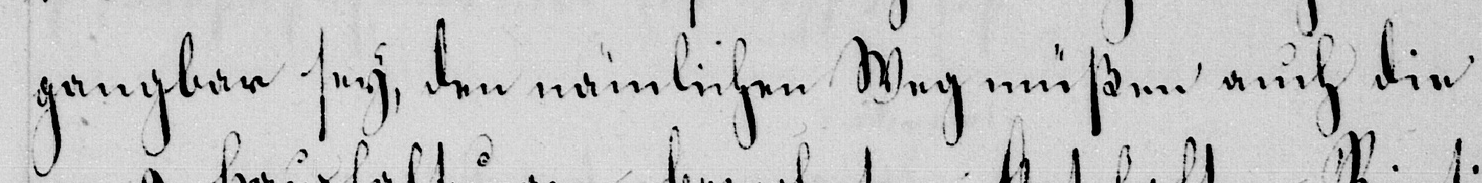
gangbar sey, den nämlichen Weg müßen auch die
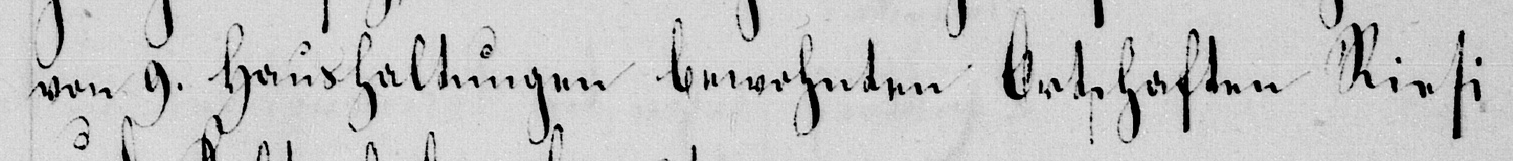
von 9. Haushaltungen bewohnten Ortschaften Riesi
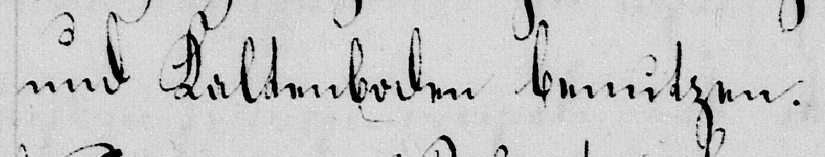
und Kaltenboden benutzen.
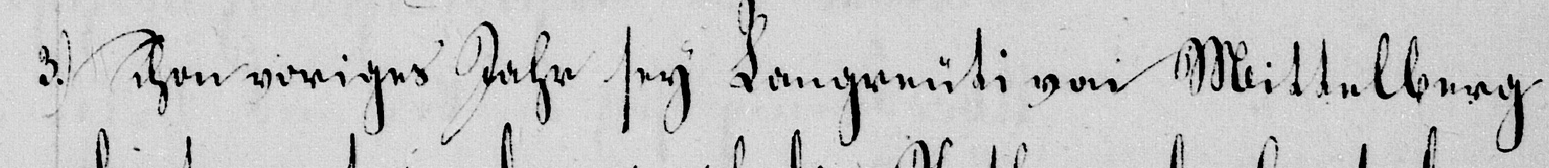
3.) Schon voriges Jahr sey Langerüti von Mittelberg
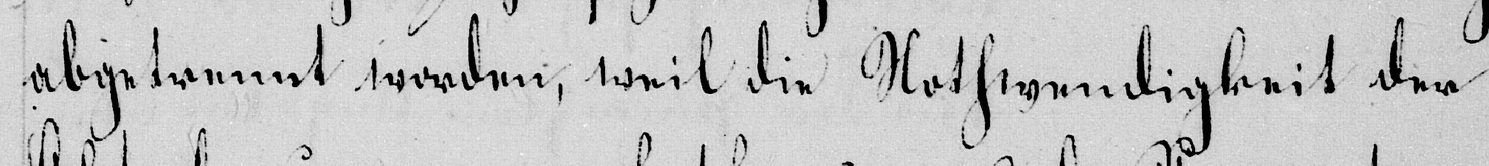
abgetrennt worden, weil die Nothwendigkeit der
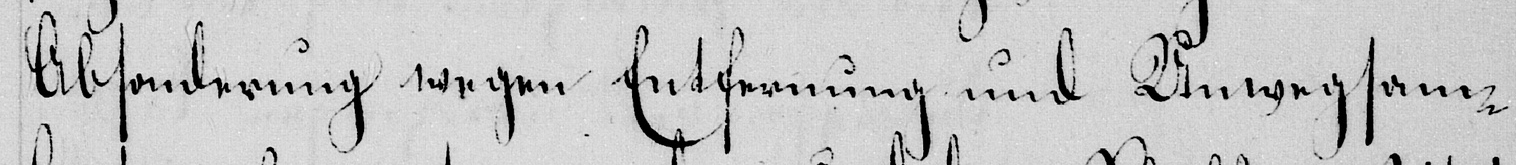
Absonderung wegen Entfernung und Unwegsam¬
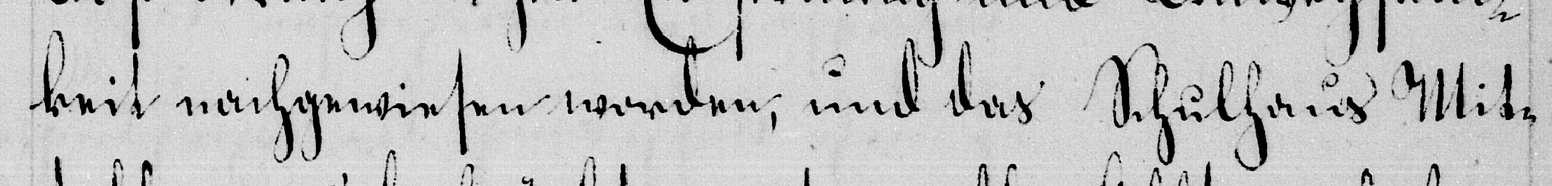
keit nachgewiesen worden; und das Schulhaus Mit¬
